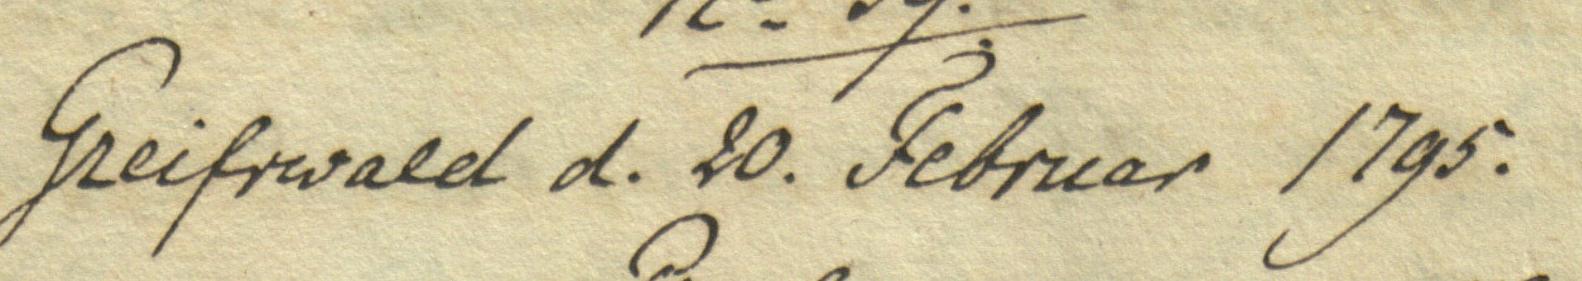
Greifswald d. 20. Februar 1795.
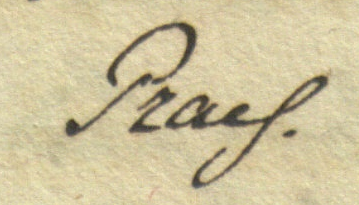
Praes.
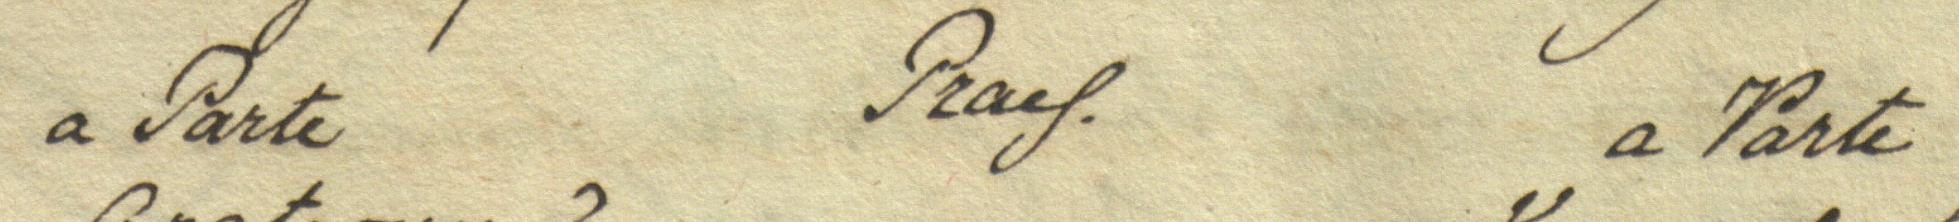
a Parte a Parte
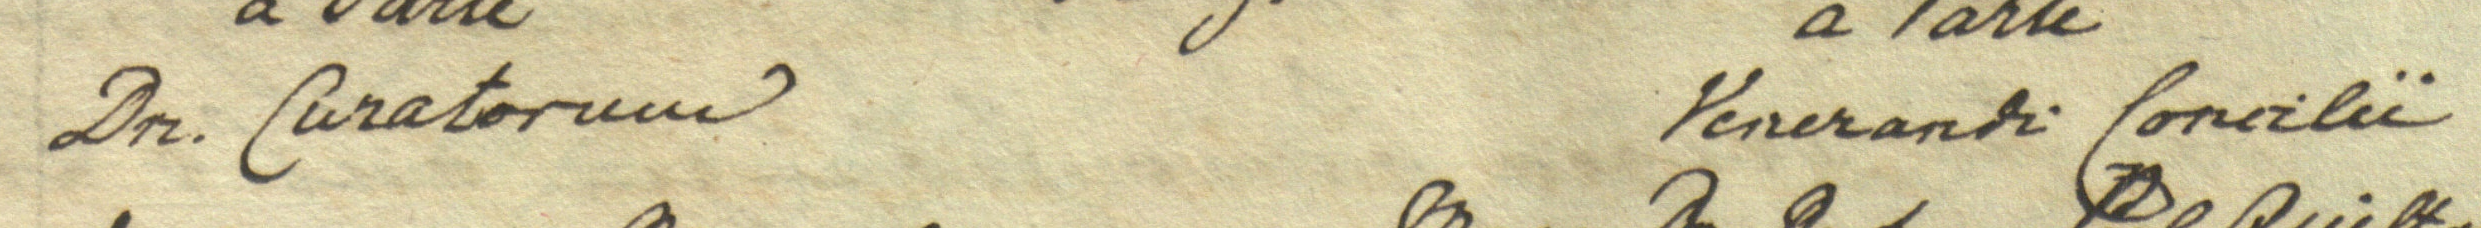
Dn. Curatorum Venerandi Concilii
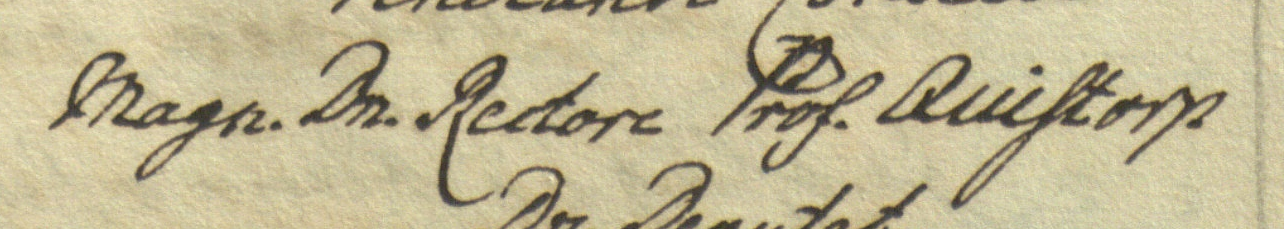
Magn. Dn. Rectore Prof. Quistorp
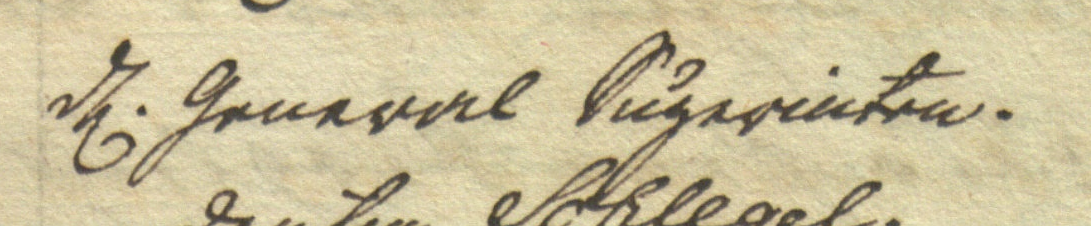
dh. General Superinten¬
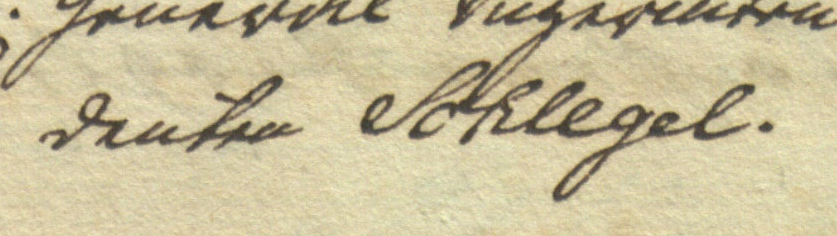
denten Schlegel.
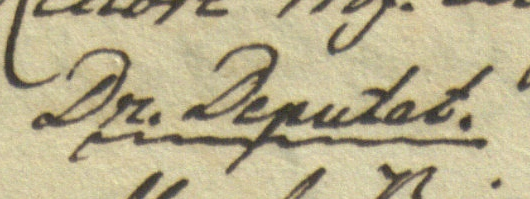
Dn. Deputat.
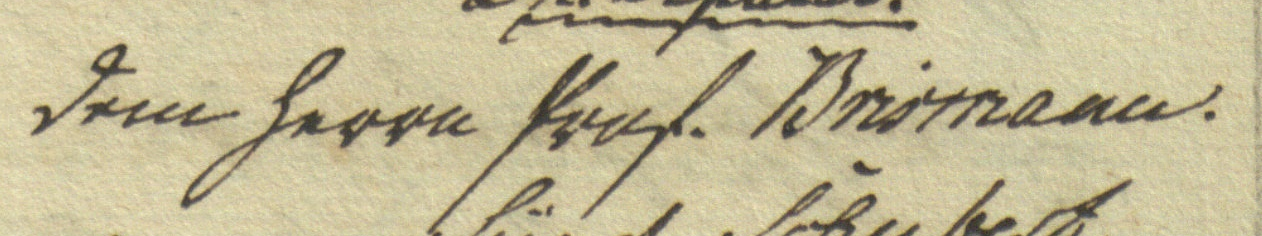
dem Herrn Prof. Brismann.
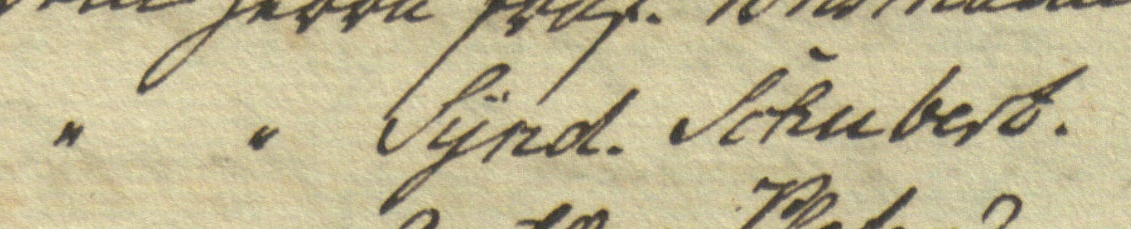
Sÿnd. Schubert.
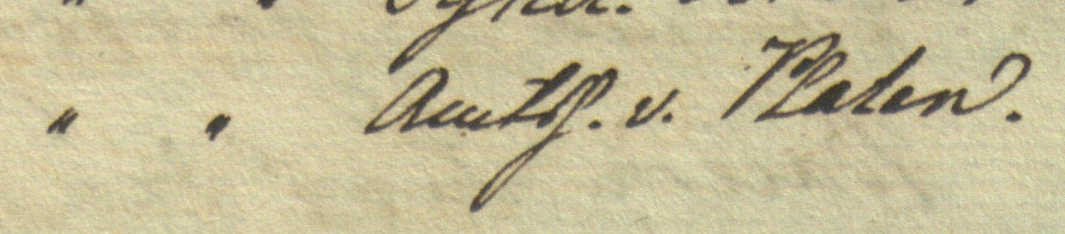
Amtsh. v. Platen.
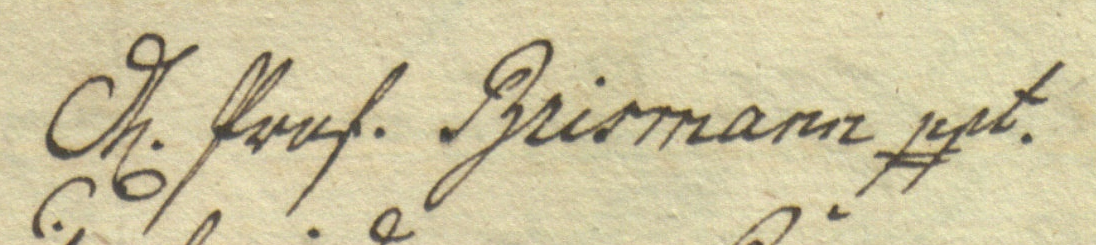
dh. Prof. Bismann ppt.
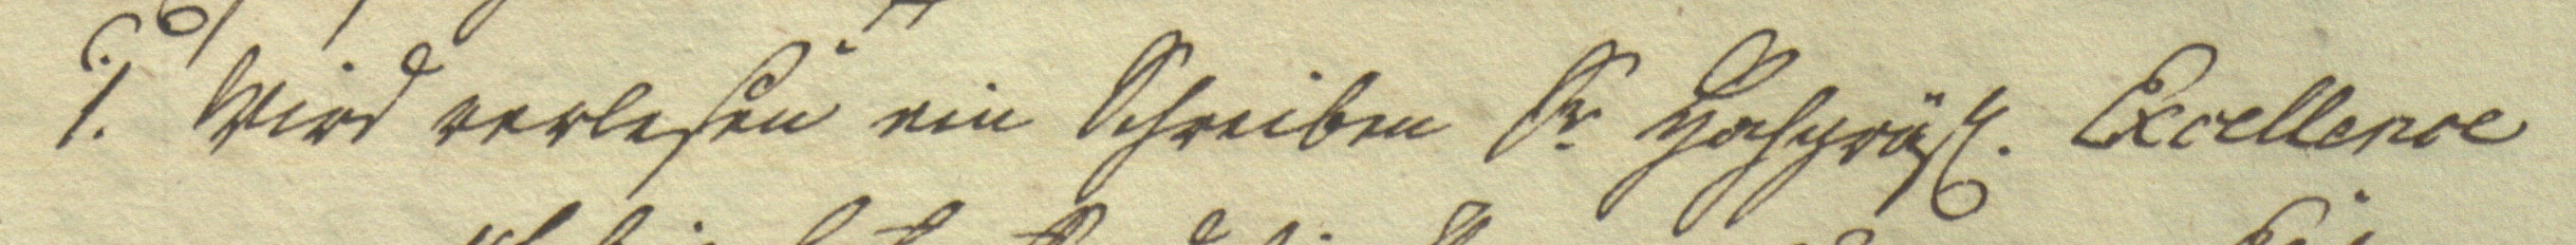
1. Wird verlesen ein Schreiben Sr Hochgräfl. Excellence
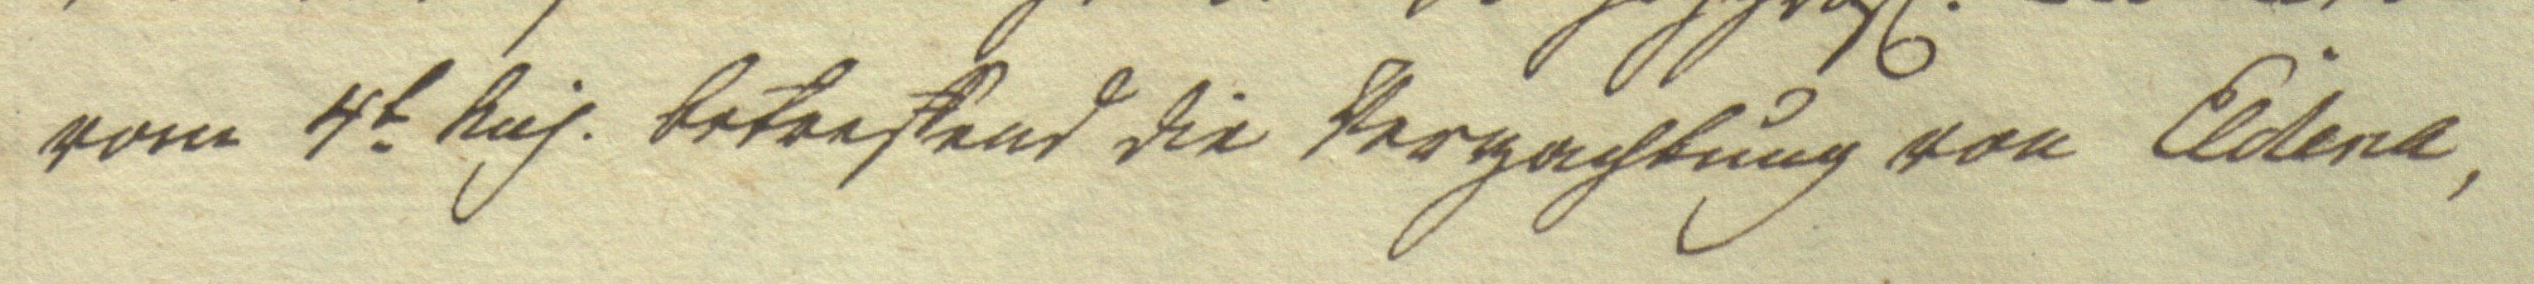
vom 4 t. huj. betreffend die Verpachtung von Eldena,
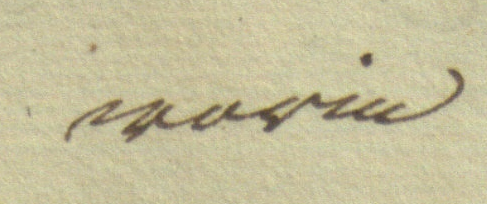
worin
